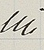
lich
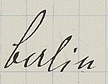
sein zu
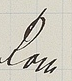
er-
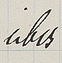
fahren,
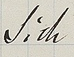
welche
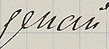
Italien in
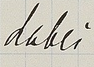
Berlin
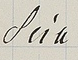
wird.
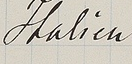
scheint
